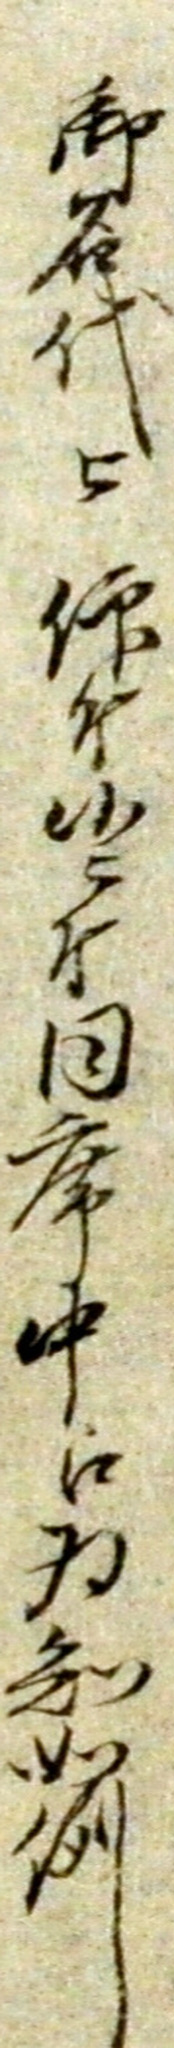御名代被仰付候ニ付同席中被為知如例
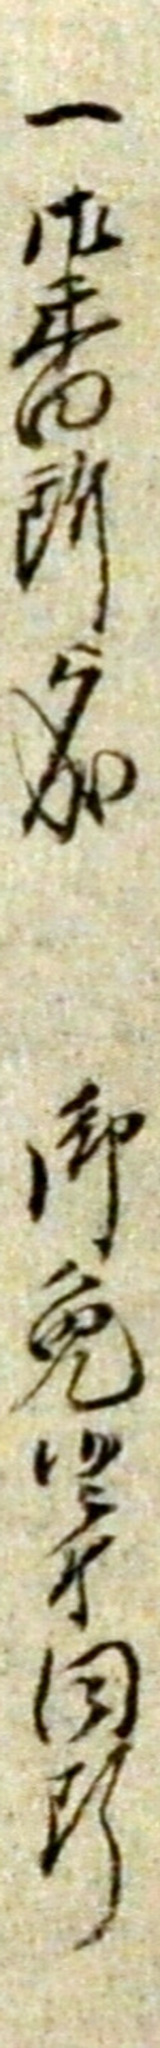一御番所被成御免候ニ付同断
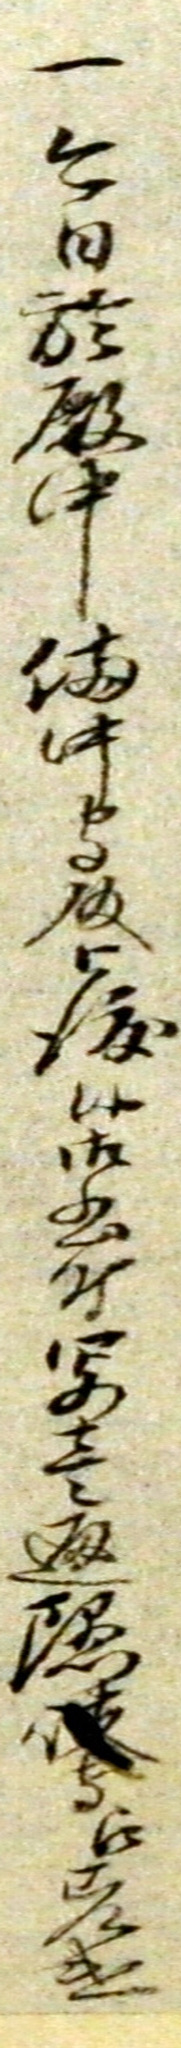一今日於殿中備中守殿被渡候御書付写壱通隠岐守江差遣
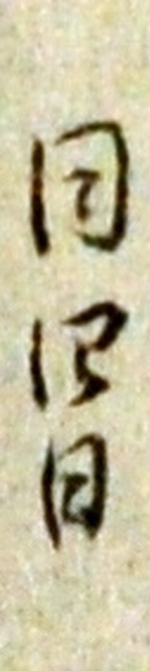同四日
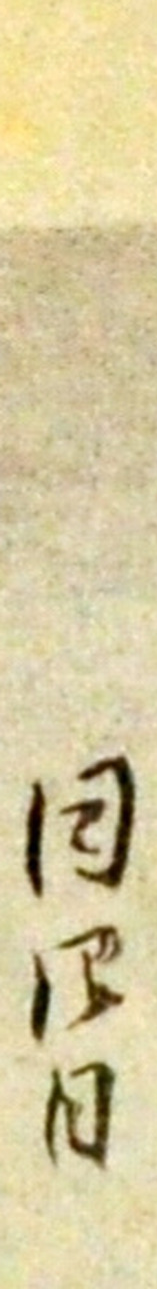同四日
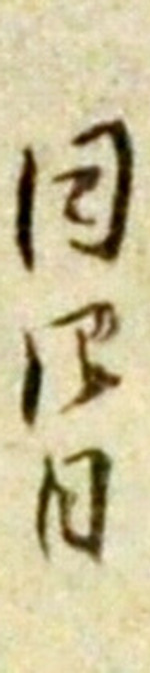同四日
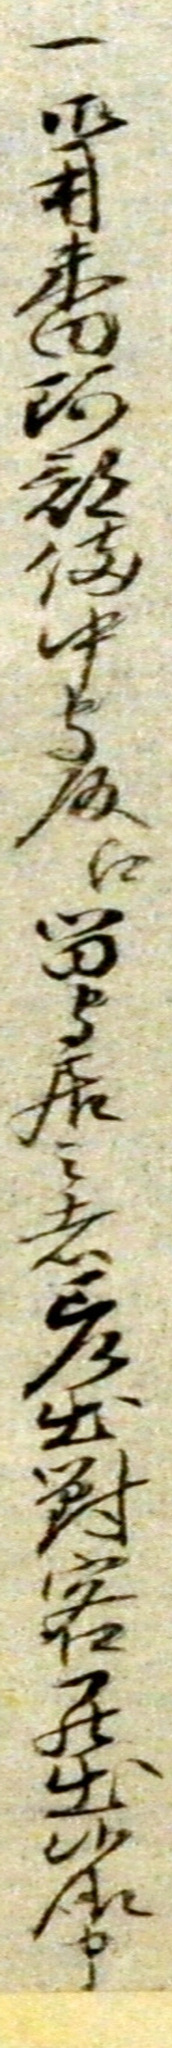一御用番阿部備中守殿江留守居之者差出対客罷出候様申
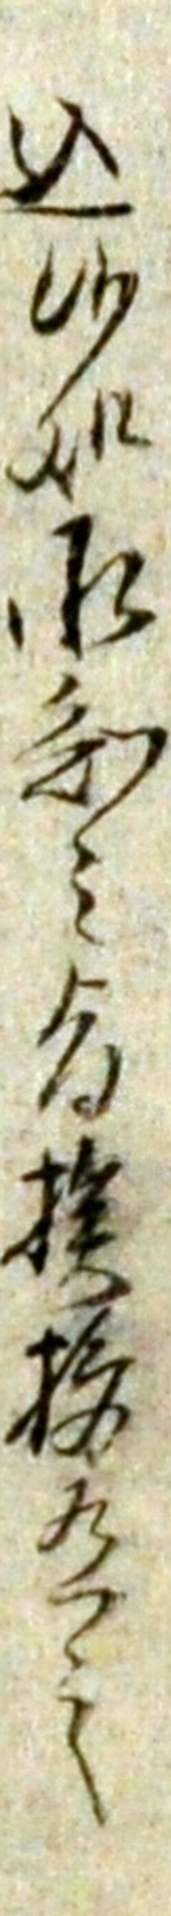込候処承知之旨挨拶有之
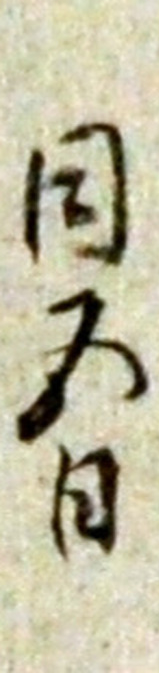同五日
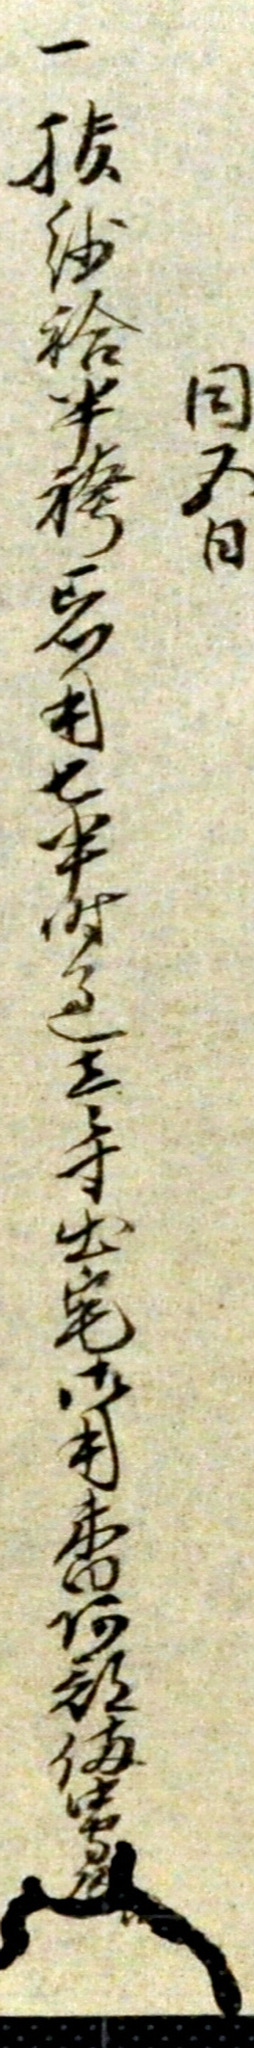一服紗袷半袴着用七半時過壱寸出宅御用番阿部備中守殿江
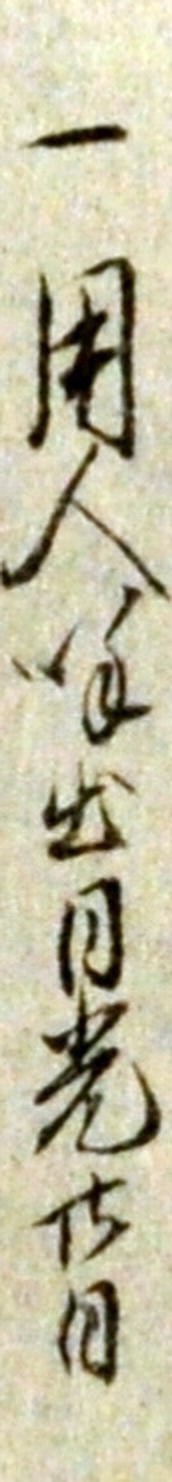一用人呼出日光廿日
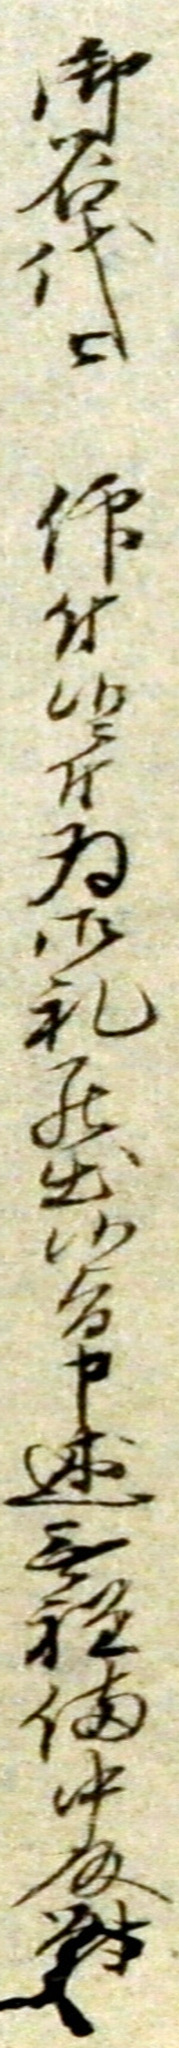御名代被仰付候ニ付為御礼罷出候旨申述無程備中殿対
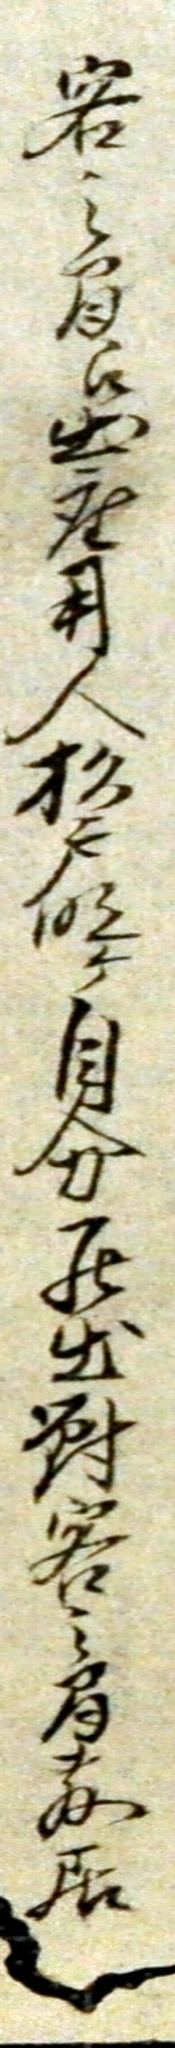客之間江出座用人杉戸明ヶ自分罷出対客之敷居
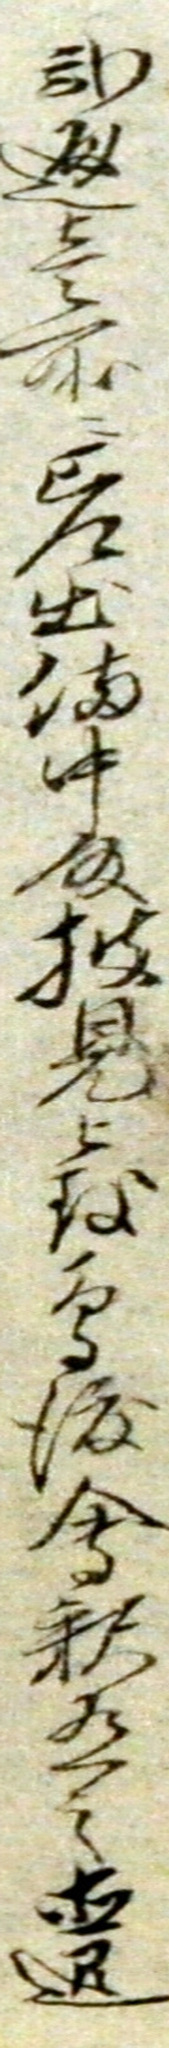弐通壱所ニ差出備中殿披見被致鳥渡会釈有之直退

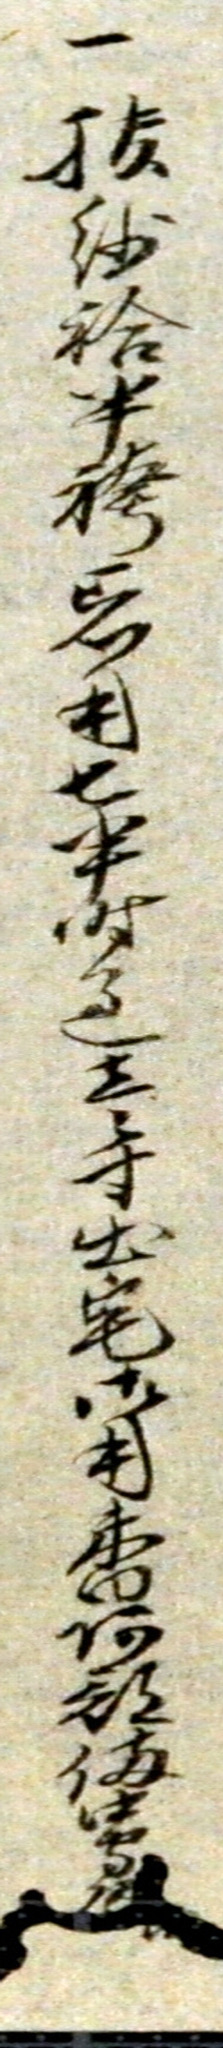一服紗袷半袴着用七半時過壱寸出宅御用番阿部備中守殿江
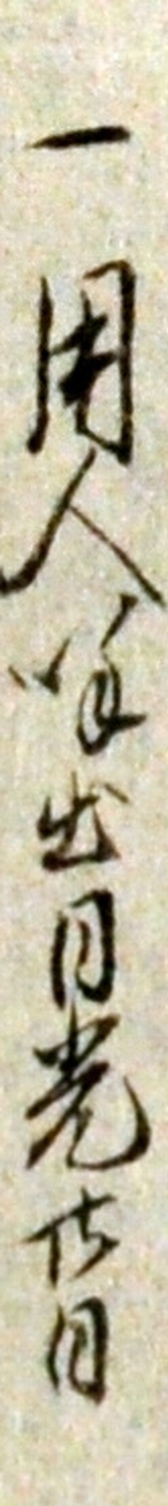一用人呼出日光廿日
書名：日光御名代相勤候節ノ留
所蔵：伊那市立高遠町図書館・合同会社AMANE
